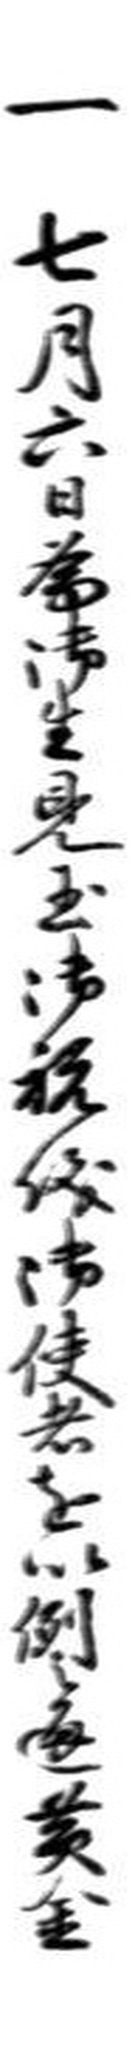一七月六日為御生見玉御祝儀御使者を以例之通黄金
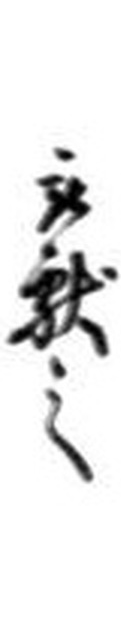被献之
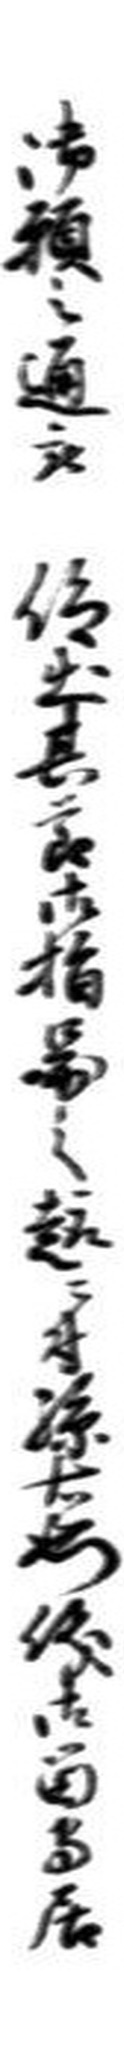御願之通被仰出其節御指図之趣ニ付孫右衛門儀御留守居
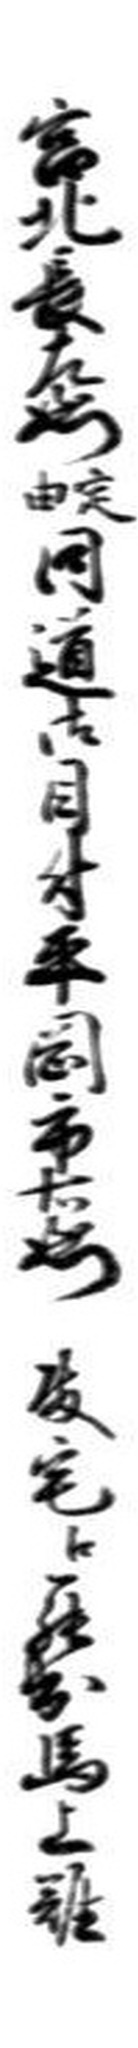宮北長左衛門定由同道御目付平岡市右衛門殿宅江罷出馬上難
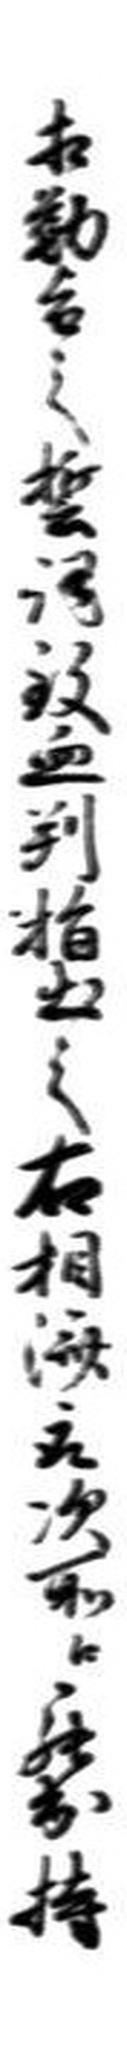相勤旨之誓詞致血判指出之右相済取次所江罷出持
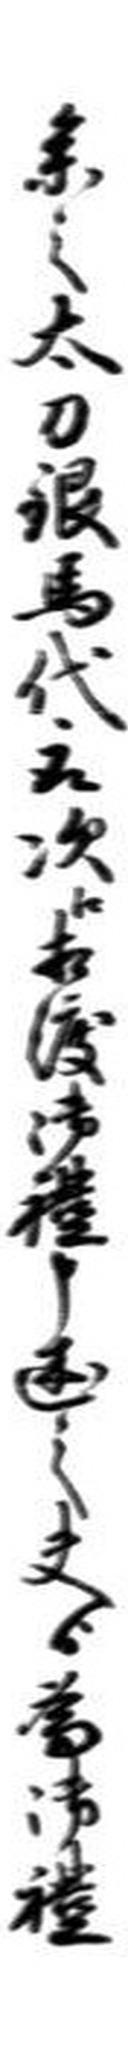参之太刀銀馬代取次江相渡御礼申述之夫ゟ為御礼
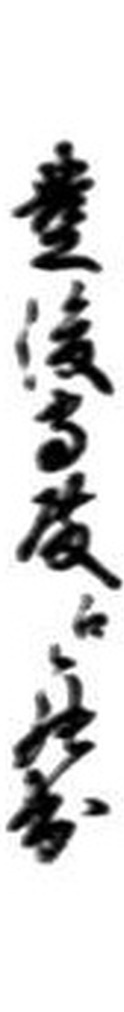豊後守殿江罷出

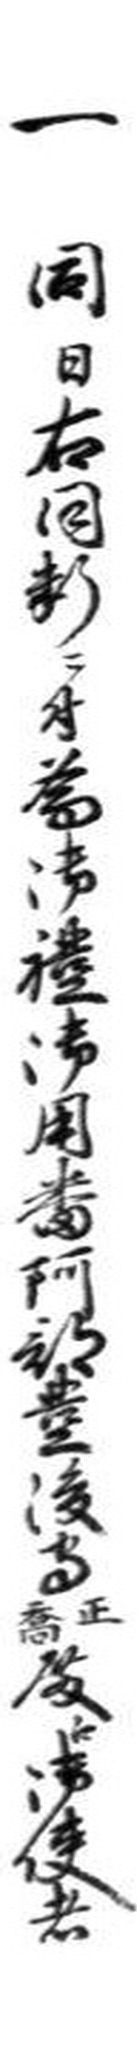一同日右同断ニ付為御礼御用番阿部豊後守正喬殿江御使者
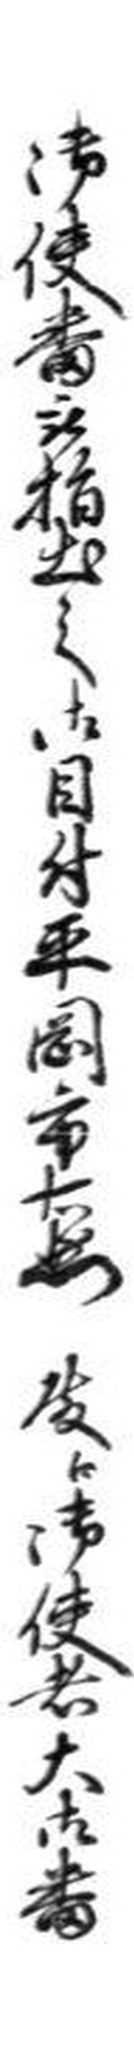御使番被指出之御目付平岡市右衛門殿江御使者大御番
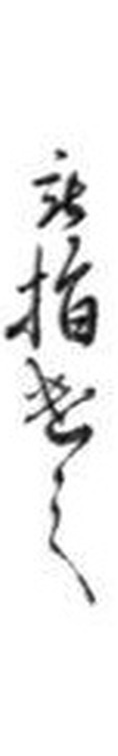被指遣之
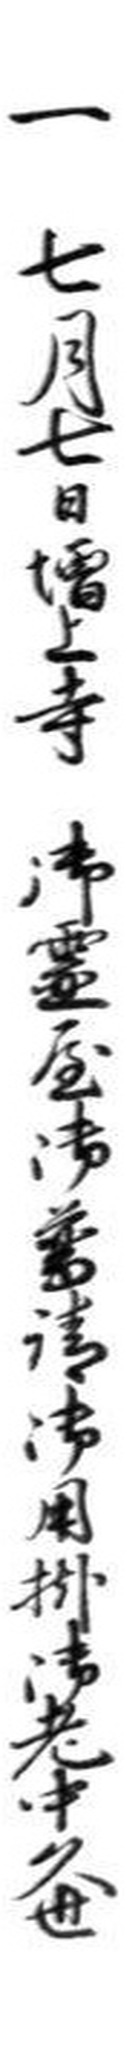一七月七日増上寺御霊屋御普請御用掛御老中久世
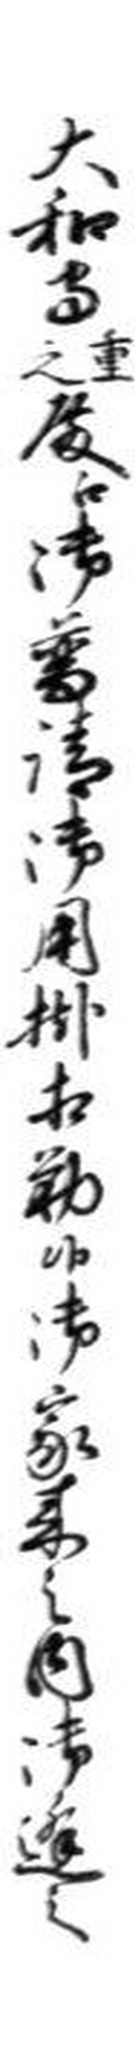大和守重之殿江御普請御用掛相勤候御家来之内御逢之
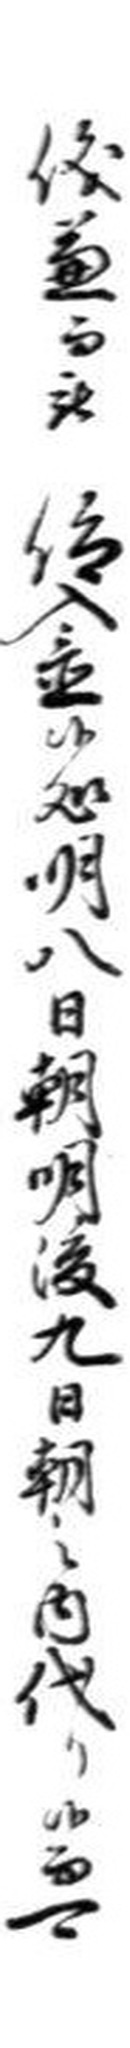儀兼而仰入置候処明八日朝明後九日朝之内代リ候而可
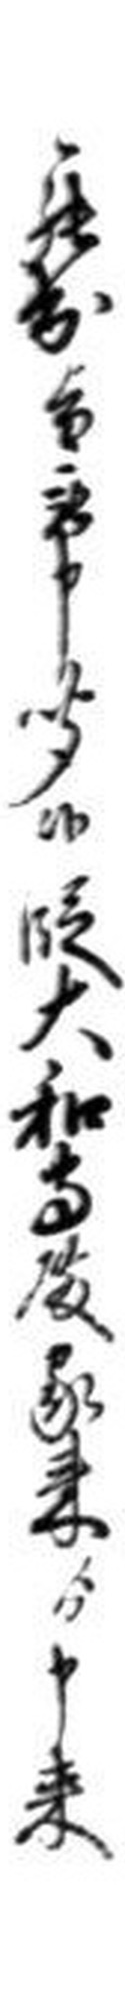罷出旨被申聞候段大和守殿家来ゟ申来
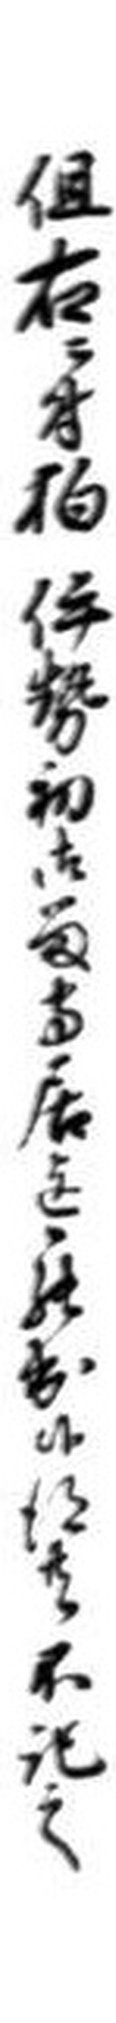但右ニ付狛伊勢初御留守居迄罷出候得共不記之
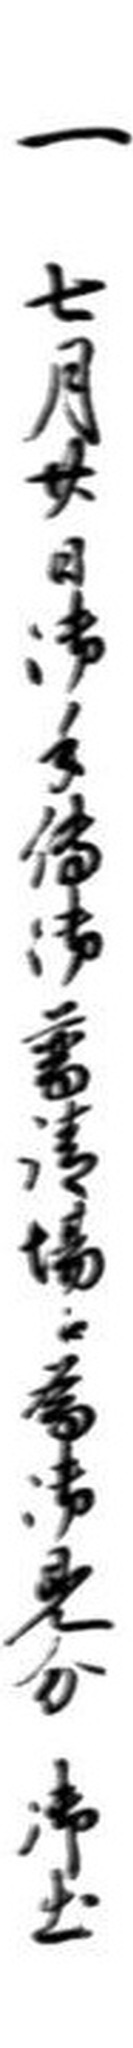一七月廿日御手伝御普請場江為御見分御出
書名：家譜 三十一 吉邦公 享保元年
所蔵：福井県文書館 Fukui Prefectural Archives
